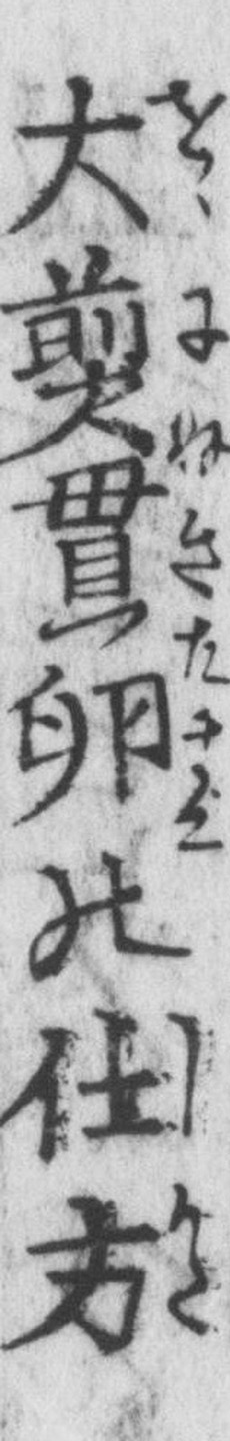大煎貫卵の仕方
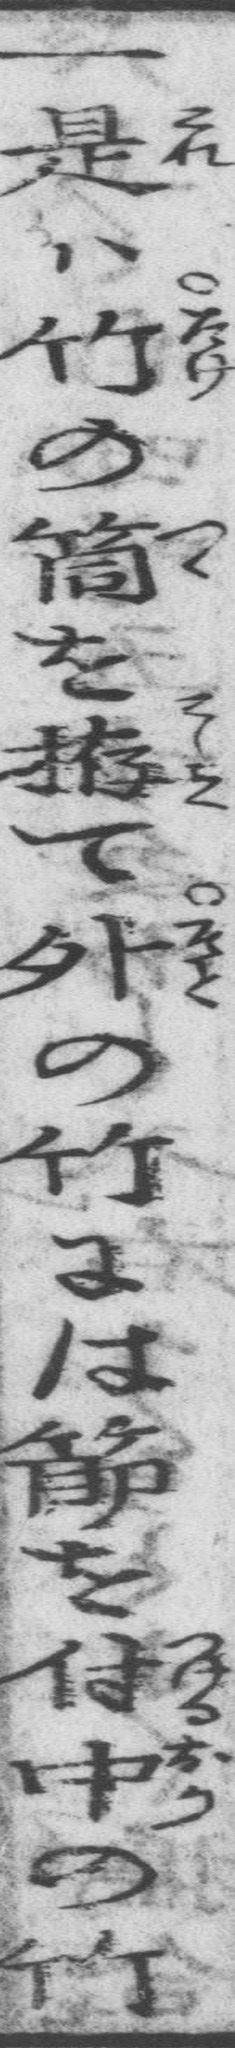一是は。竹の筒を拵て。外の竹には節を付中の竹
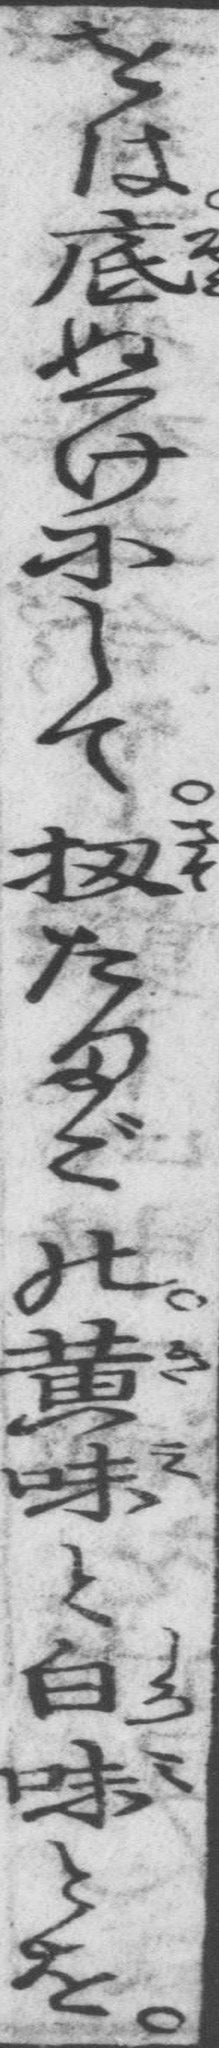をは。底ぬけにして、扨たまごの。黄味と白味とを。
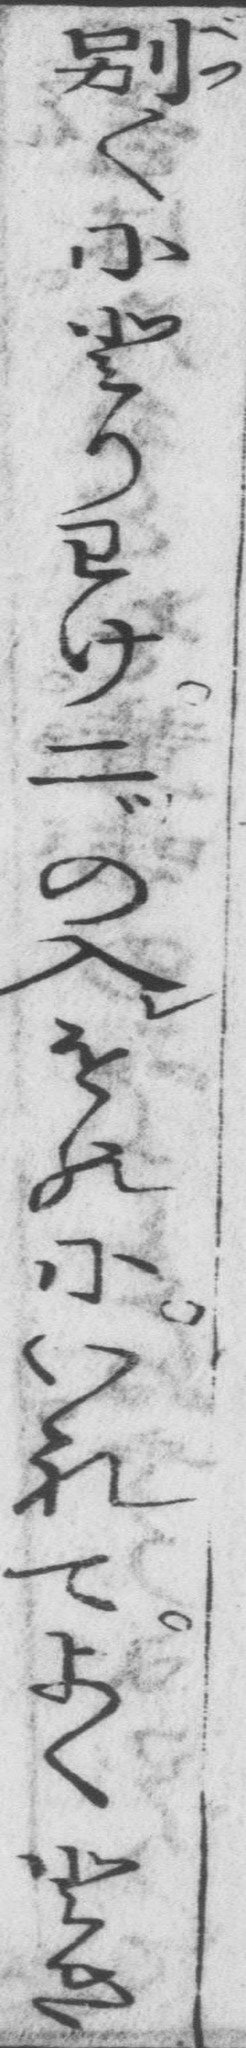別々にとりわけ。二ツの入れものに。いれて。よくとき
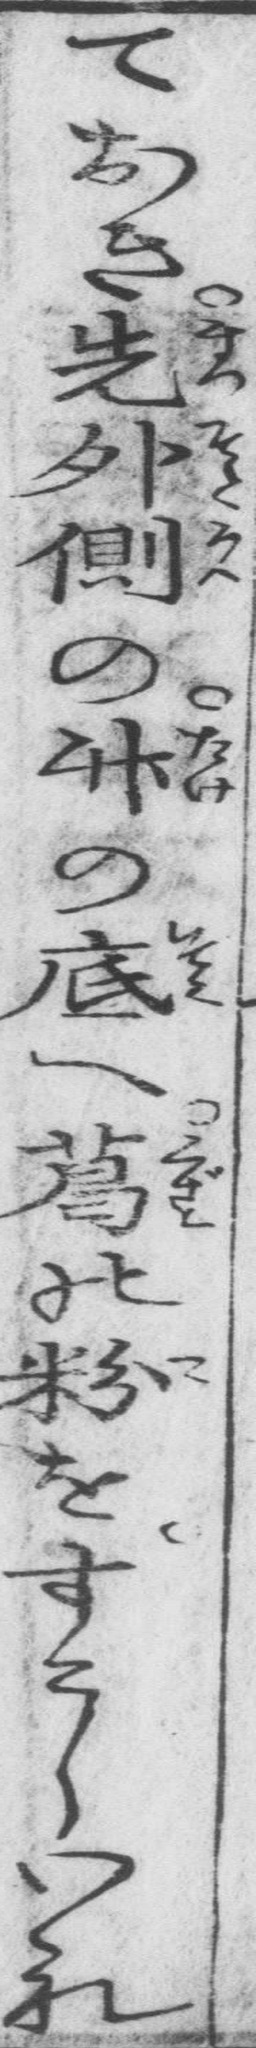ておき。先外側の。竹の底へ。葛の粉をすこしいれ
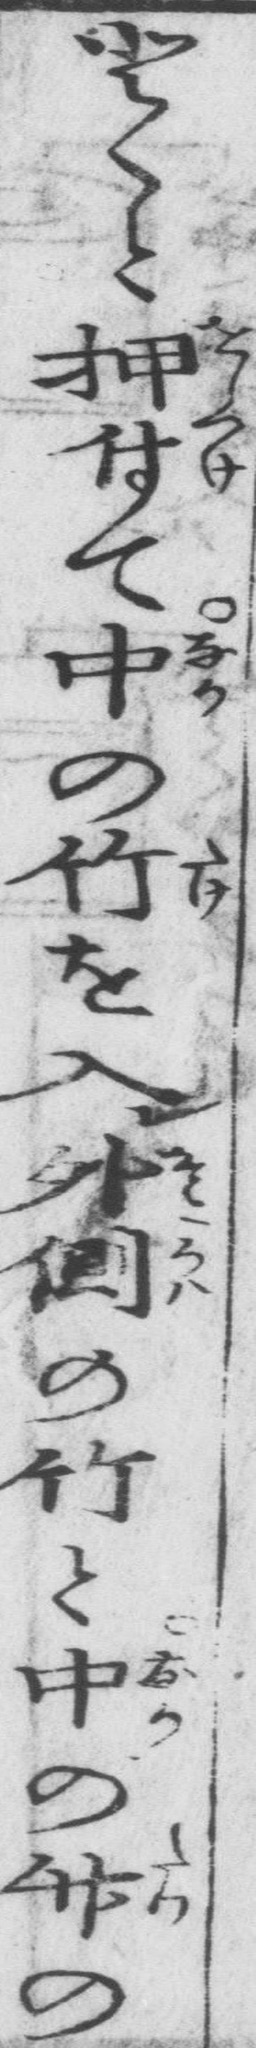とくと押付て。中の竹を入れ外側の竹と。中の竹の
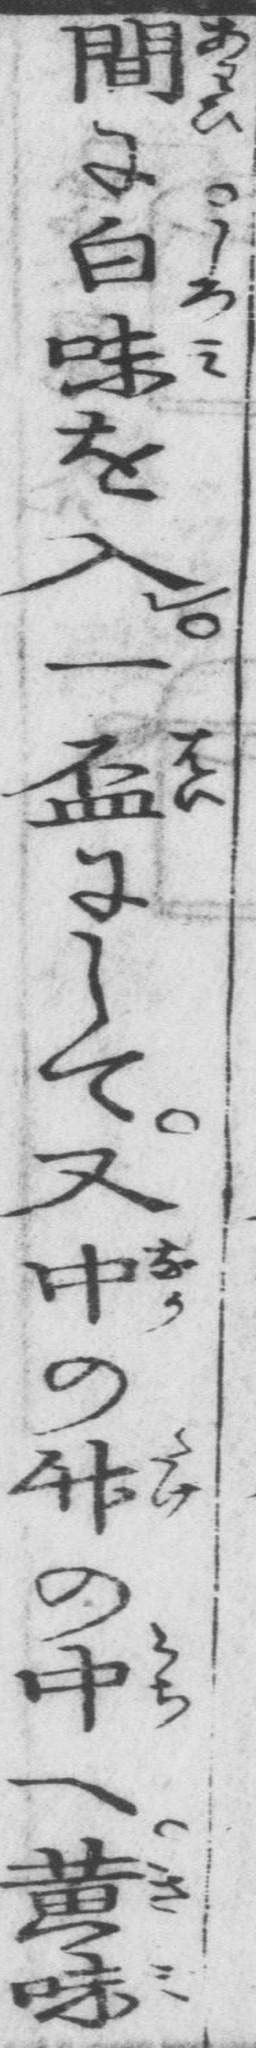間に。白味を入れ。一盃にして。又中の竹の中へ。黄味
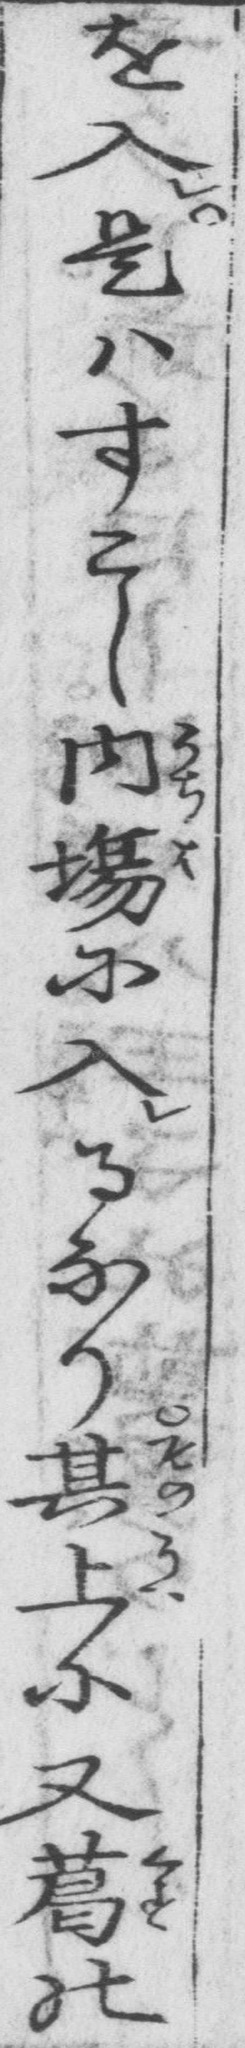を入れ。是はすこし内場に入れるなり。其上に又葛の
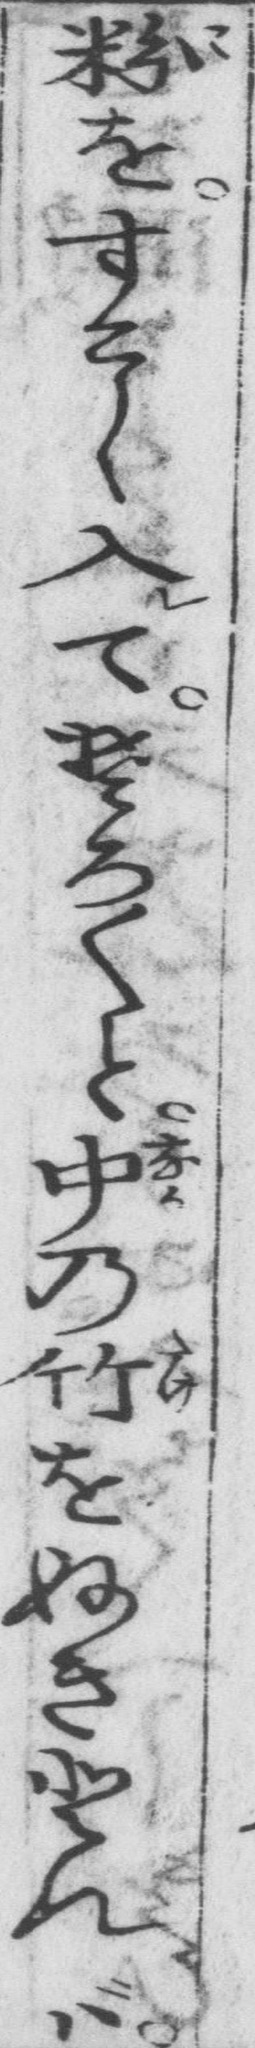粉を。すこし入れて。そろ〳〵と。中の竹をぬきとれば。
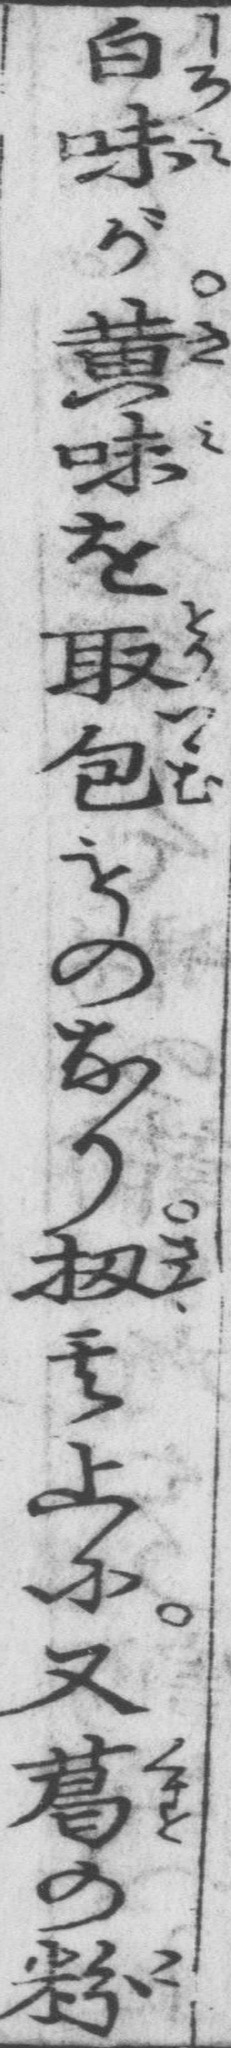白味が。黄味を取包ものなり。扨其上に。又葛の粉
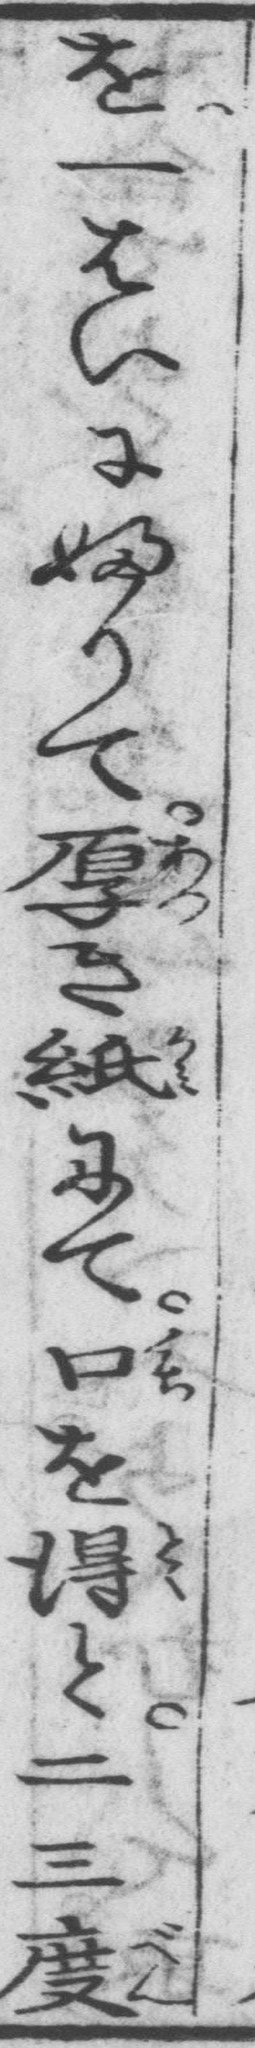を。一はいにふりて。厚き紙にて。口を得と。二三度

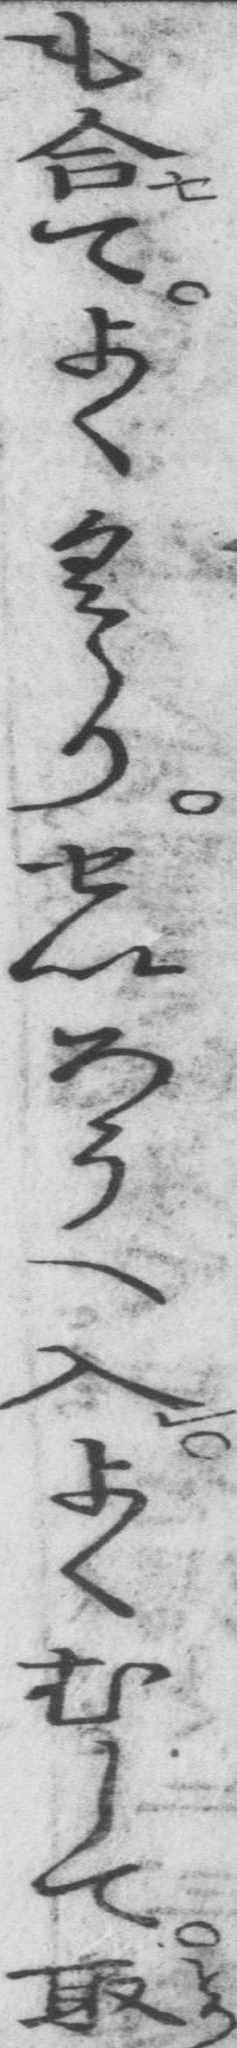も合せて。よくくゝり。せいろうへ入れ。よくむして。取
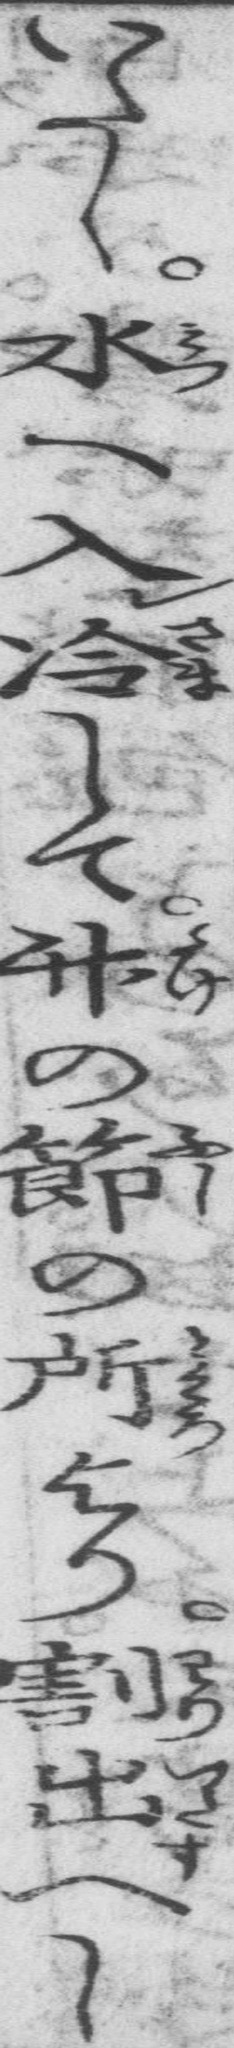いたし。水へ入れ冷して。竹の節の所より。割出へし
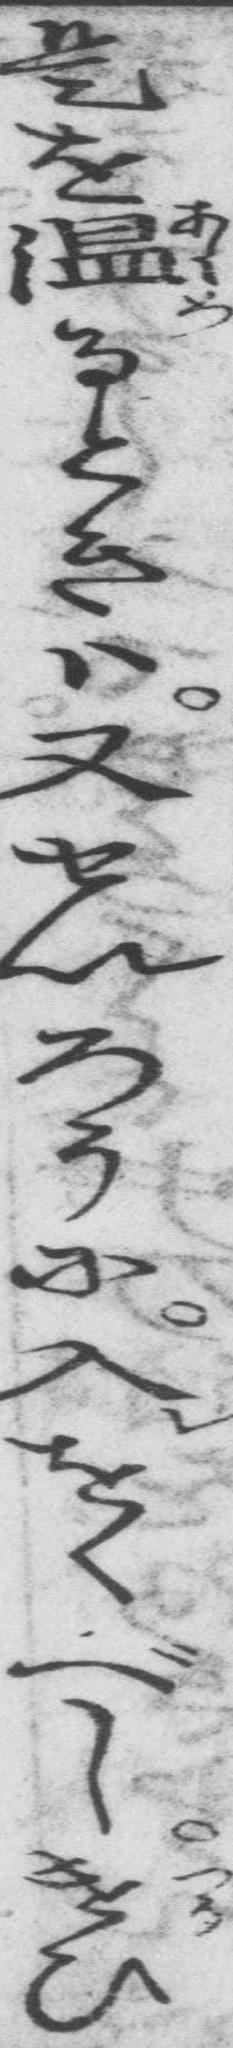是を温るときは。又せいろうに。入れをくべし。遣ひ
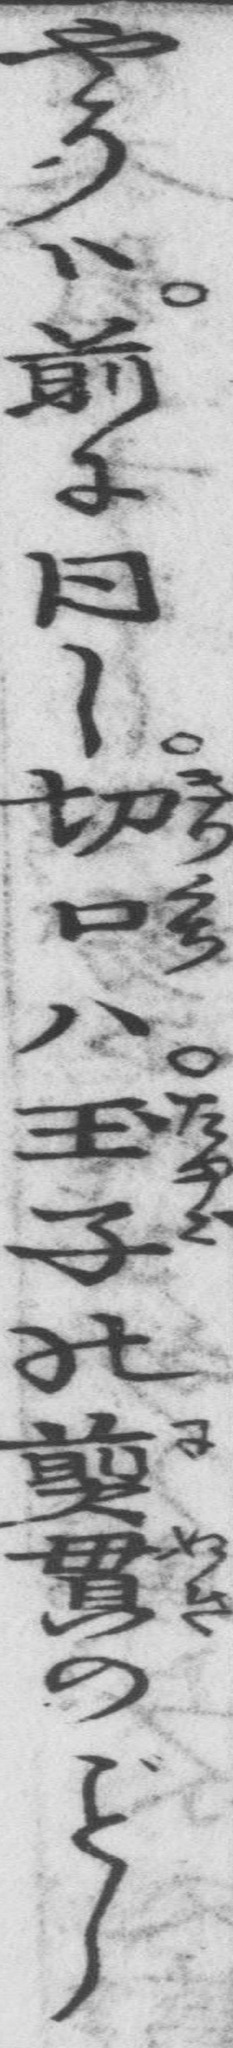やうは。前に同し。切口は。玉子の煎貫のごとし
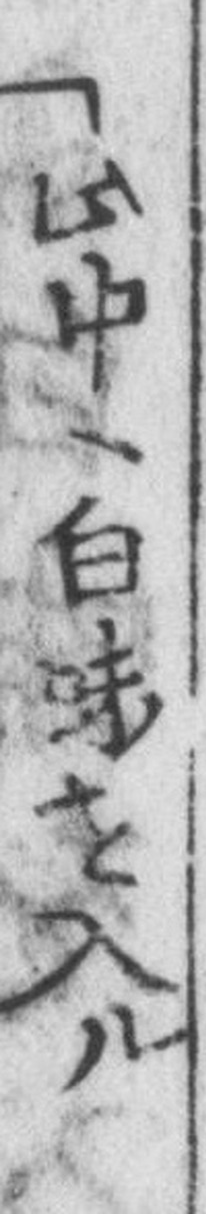此中へ白味を入る
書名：萬寳料理秘密箱
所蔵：大阪府立大学学術情報センター 国文学研究資料館
